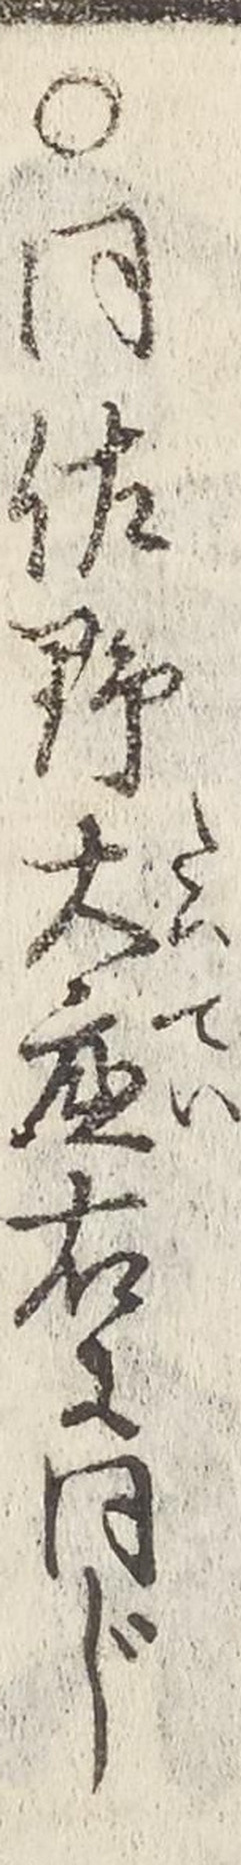○同佐野大底右に同じ

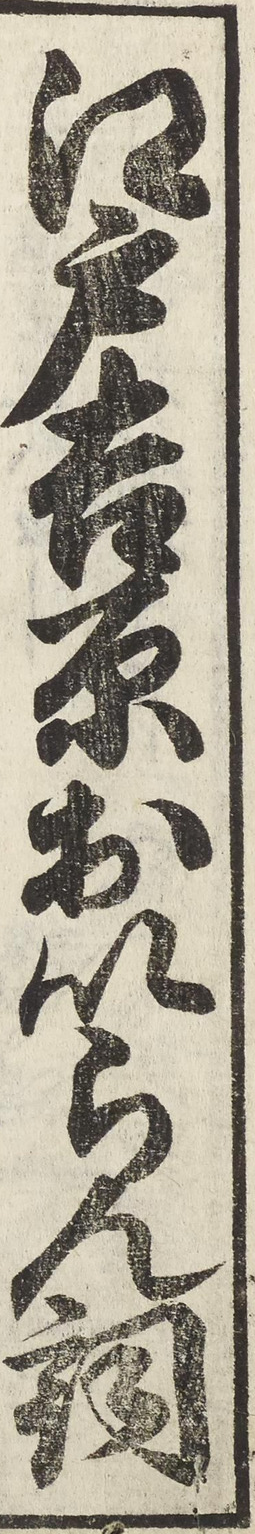江戸吉原おいらん詞
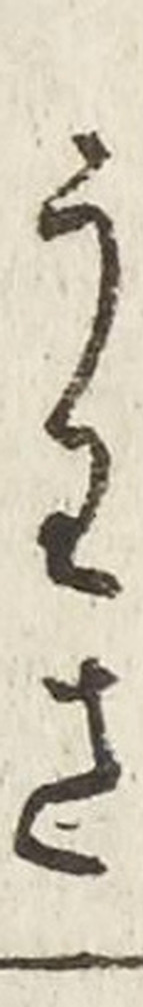うわさ
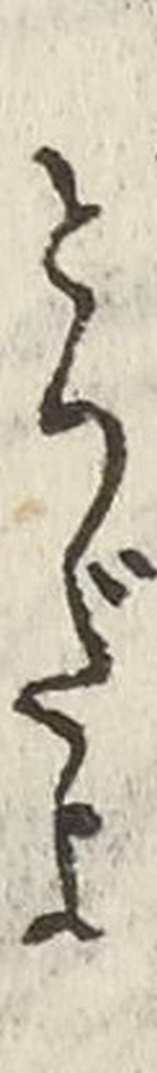とりだよ
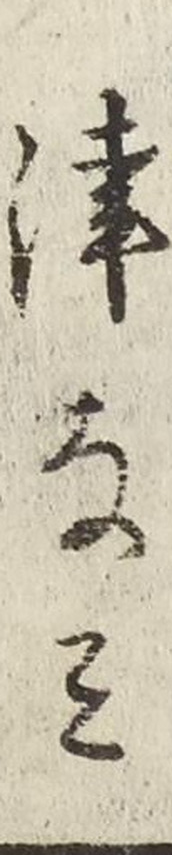つなみ
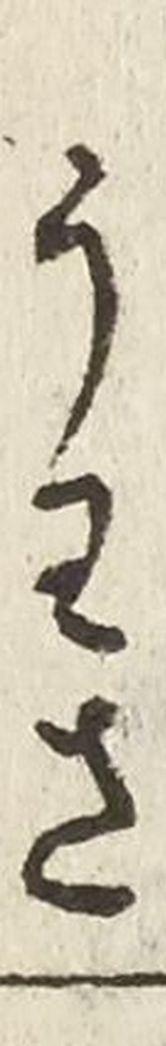うわさ
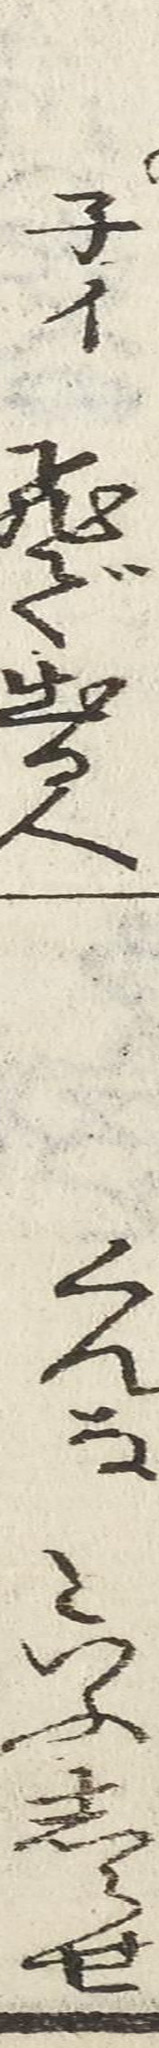ねイ飛で出る人
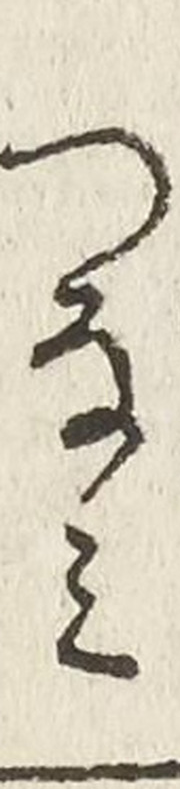つなみ
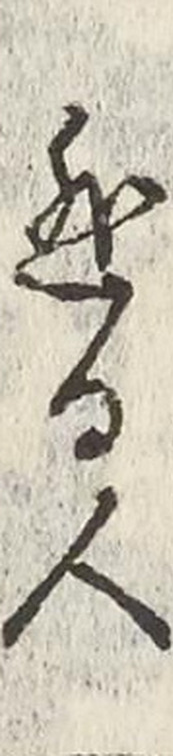逃る人
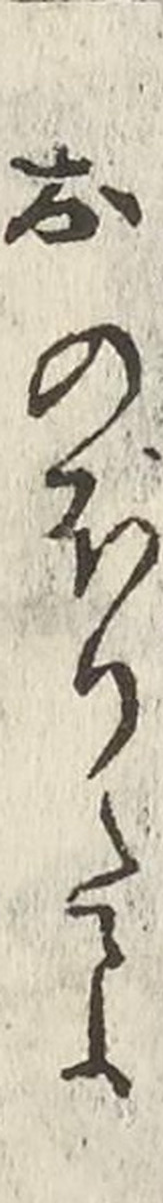おのほりたよ
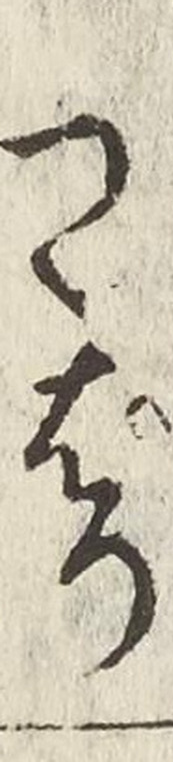つゝはり

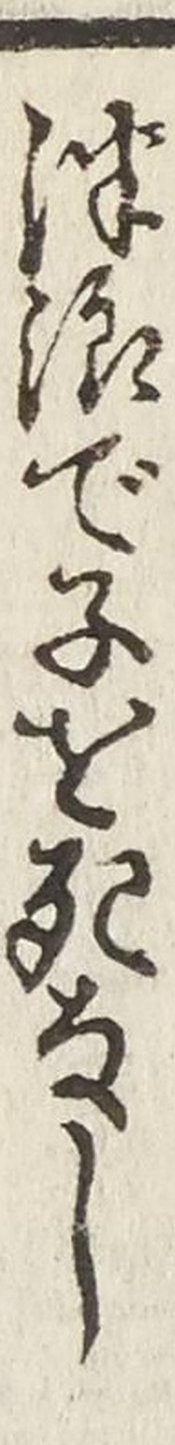津浪で子を死なし
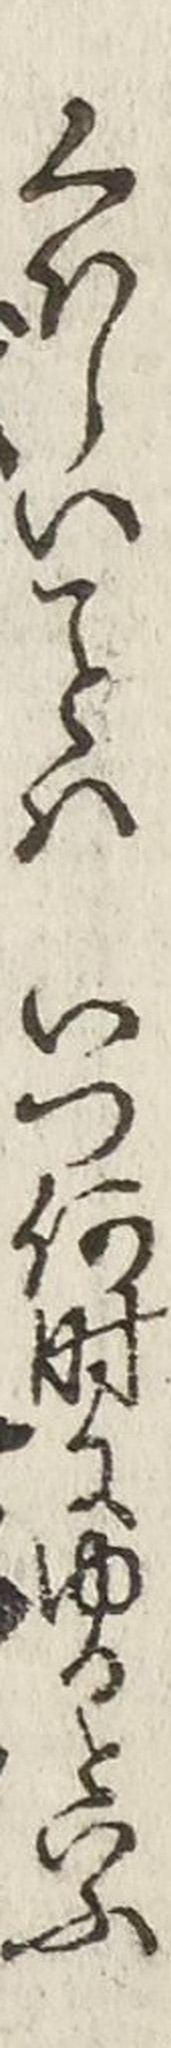くはしいことはいつ何時にゆるといふ順才
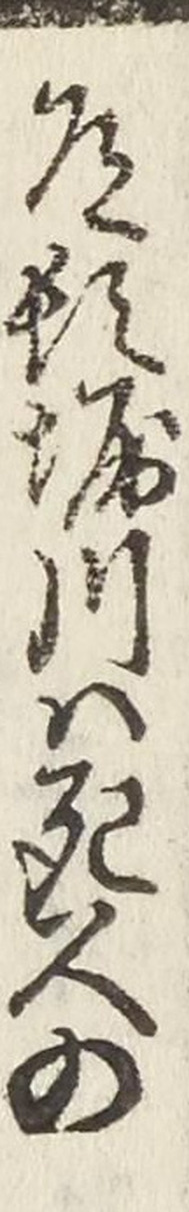道頓堀川は死人の
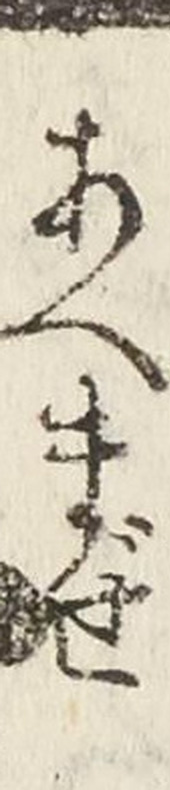あへまぜ
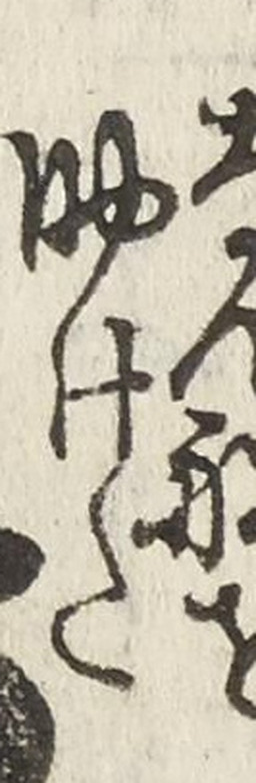助けた
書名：大地震大津浪末代噺種　（二編　全）
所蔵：東京大学地震研究所図書室 Earthquake Research Institute Library, The University of Tokyo, JAPAN
